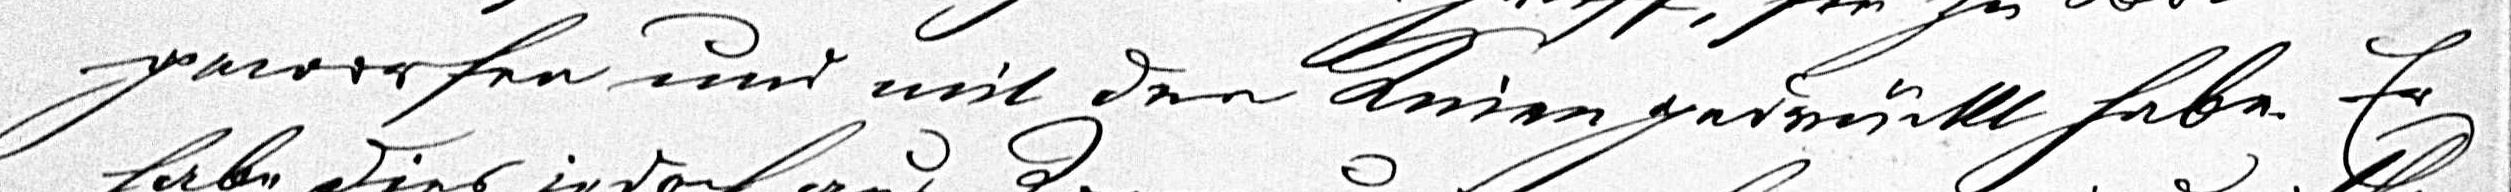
geworfen und mit den Knien gedrückt habe. Er
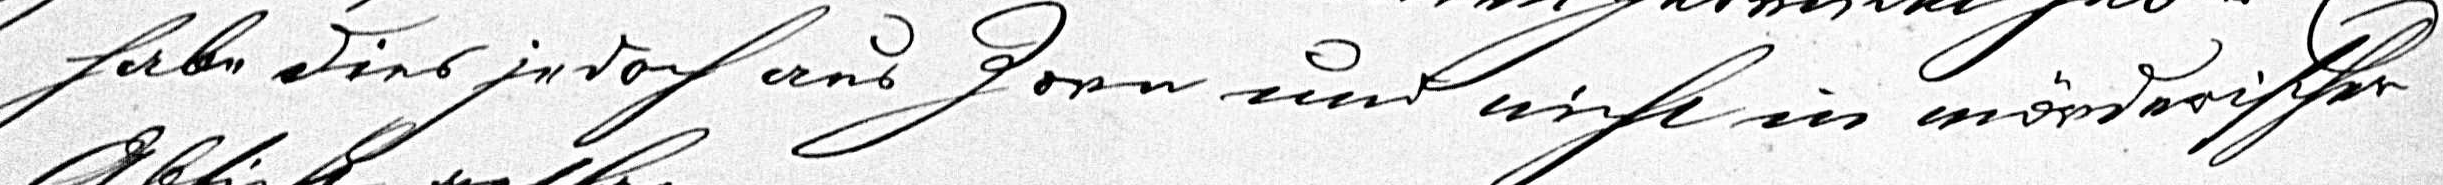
habe dies jedoch aus Zorn und nicht in mörderischer
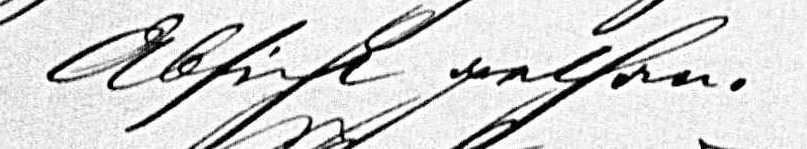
Absicht gethan.
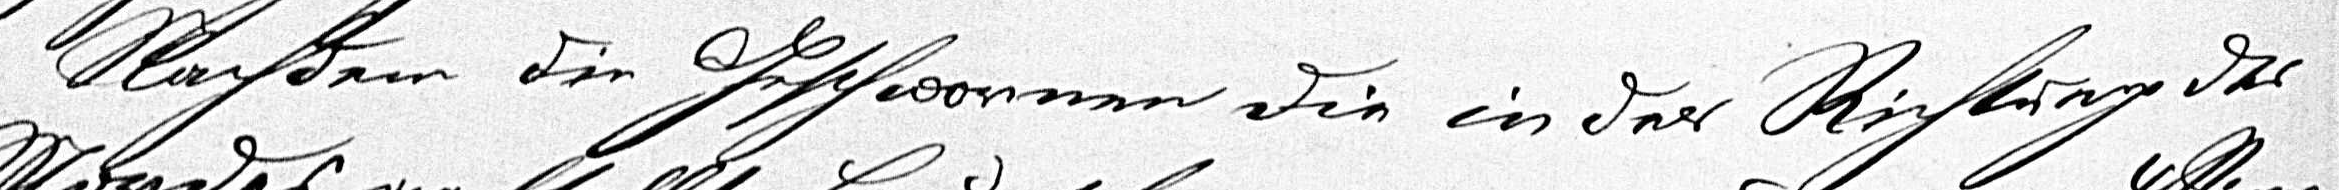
Nachdem die Geschworenen die in der Richtung des
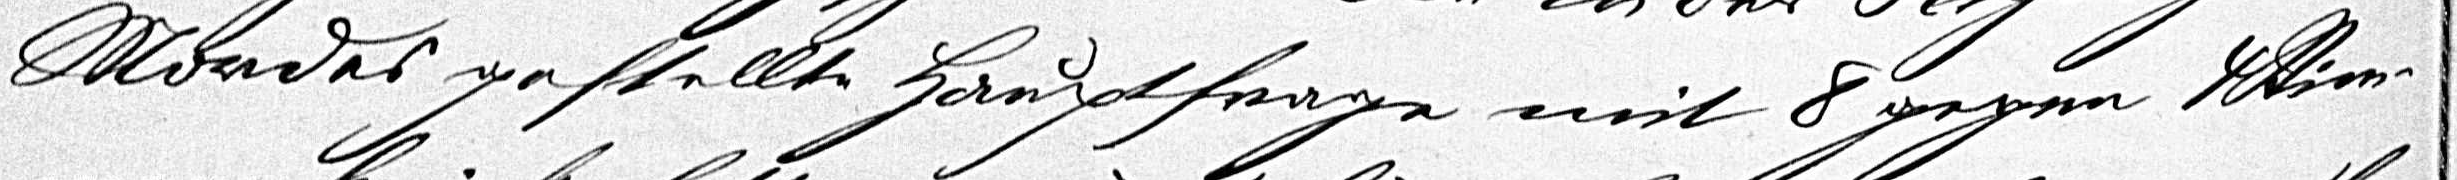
Mordes gestellte Hauptfrage mit 8 gegen 4 Stim¬
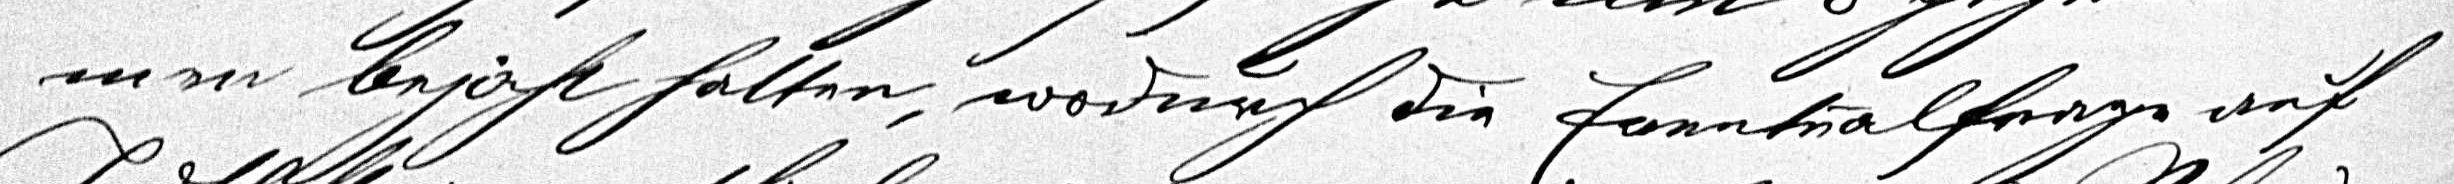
men bejahft hatten, wodruch die Eventualfrage auf
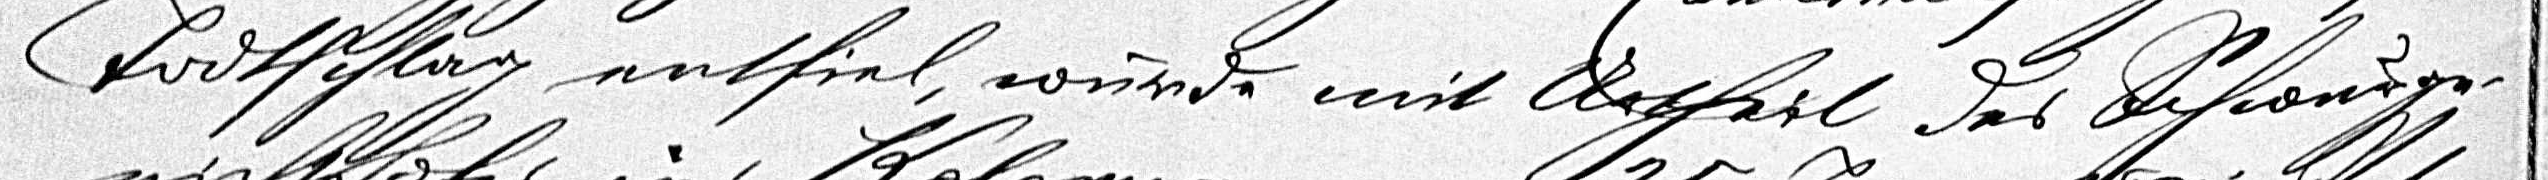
Todtschlag entfiel, wurde mit Urtheil des Schurge¬
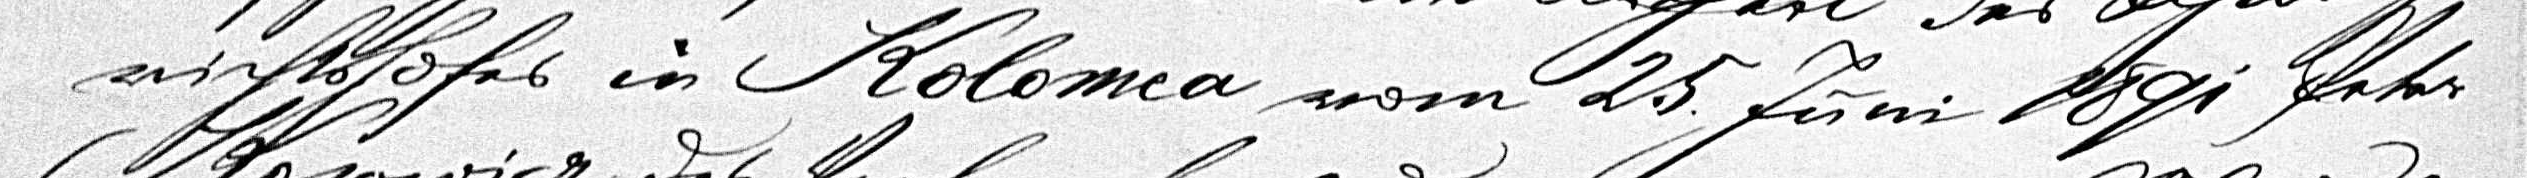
richtshofes in Kolomea vom 25. Juni 1891 Peter
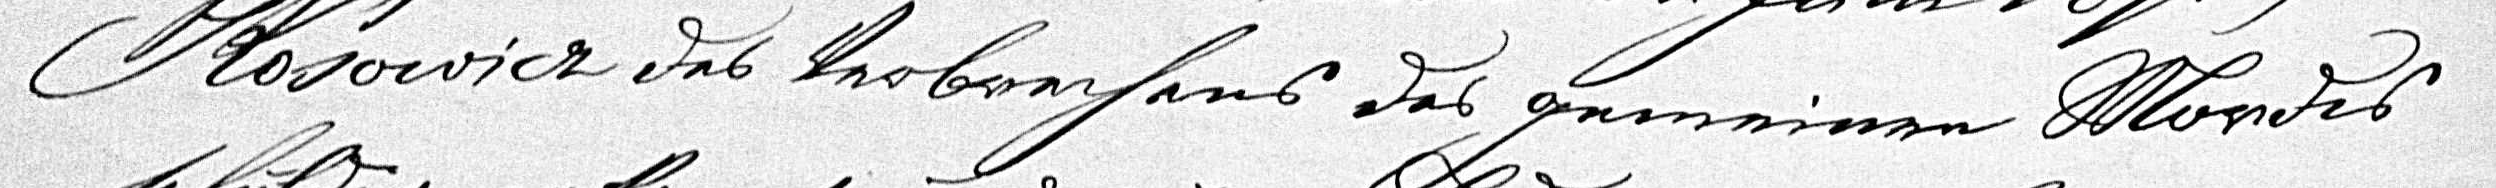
Kosowicz des Verbrechens das gemeinen Mordes
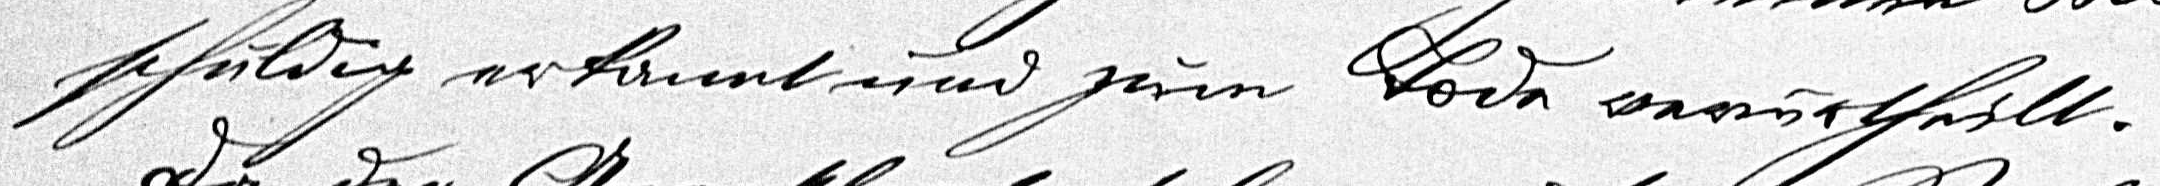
schuldig erkannt und zum Tode verurtheilt.
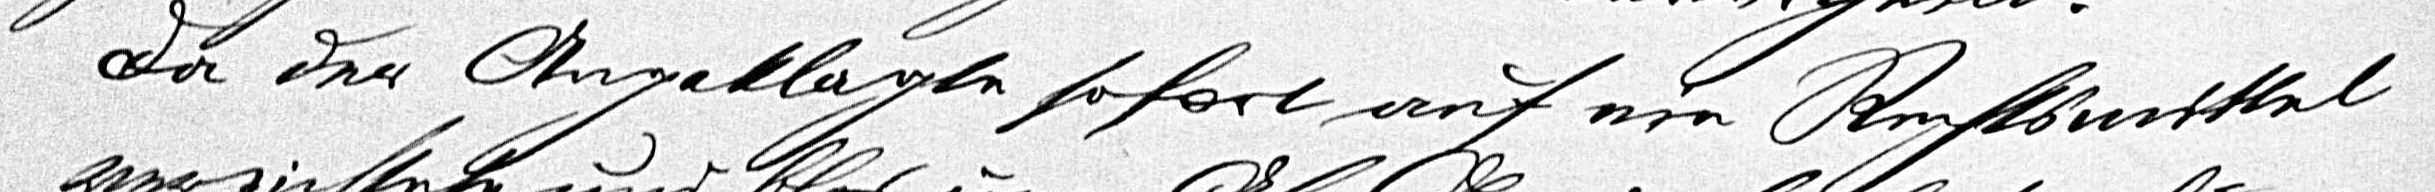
Da der Angeklagte sofort auf ein Rechtsmittel
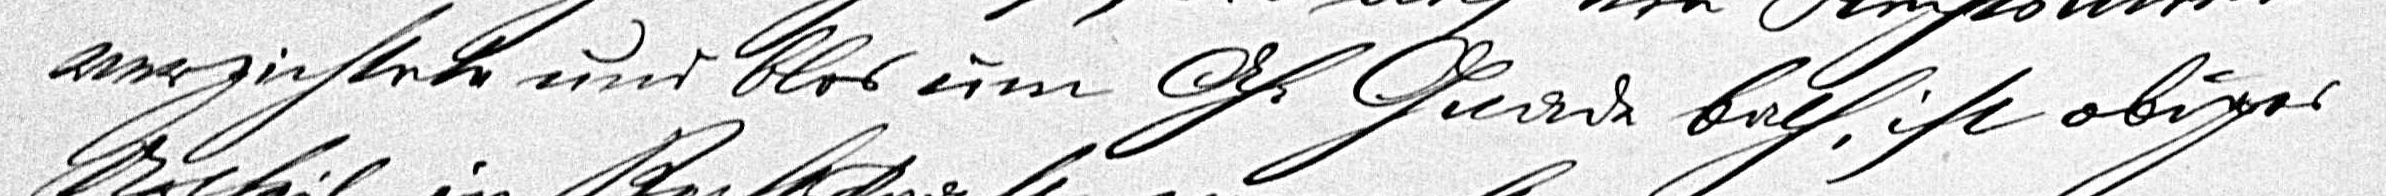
verzichtete und blos um Ah. Gnade bath, ist obiges
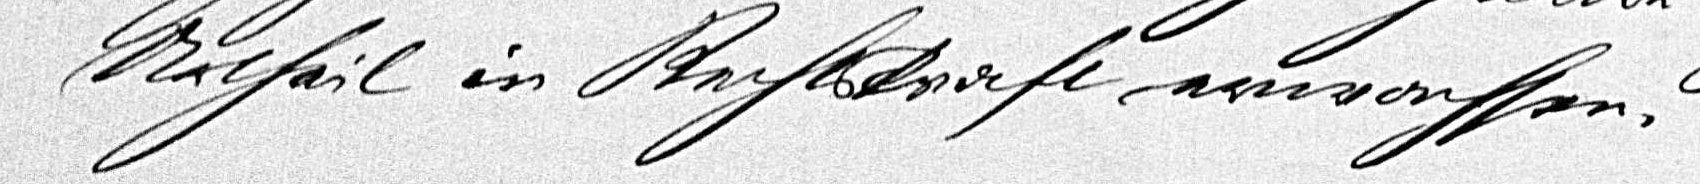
Urtheil in Rechstkraft erwachsen.
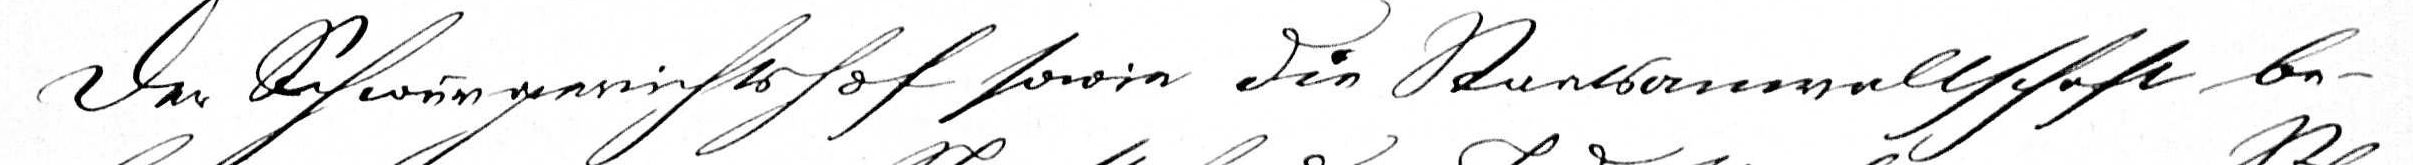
Der Schwurgerichtshof sowie die Staatsanwaltschaft be¬
